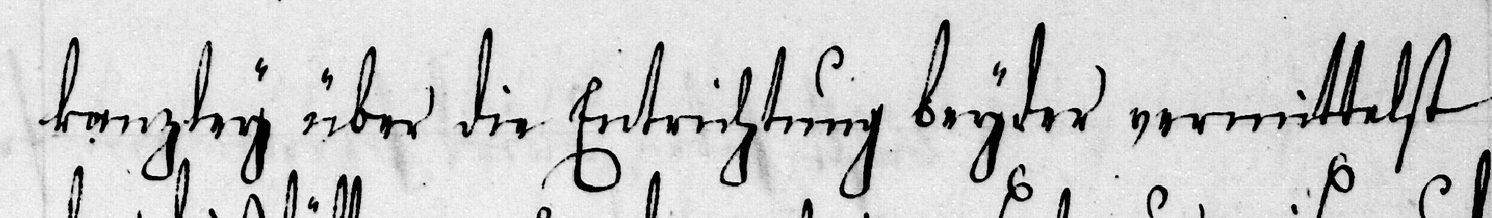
kanzley über die Entrichtung beyder vermittelst
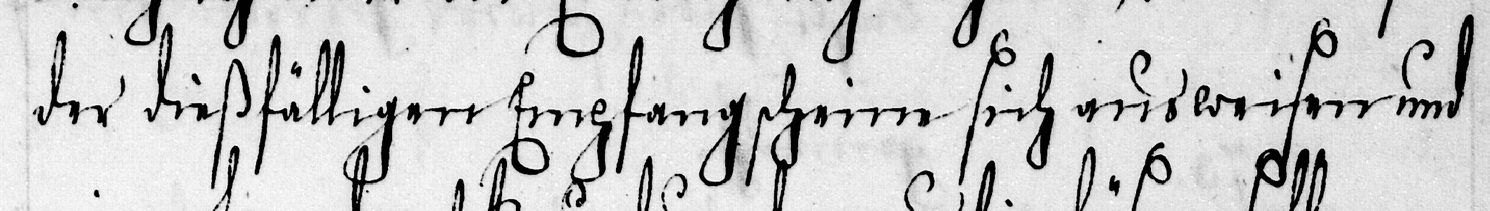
der dießfälligen Empfangscheine sich ausweisen und
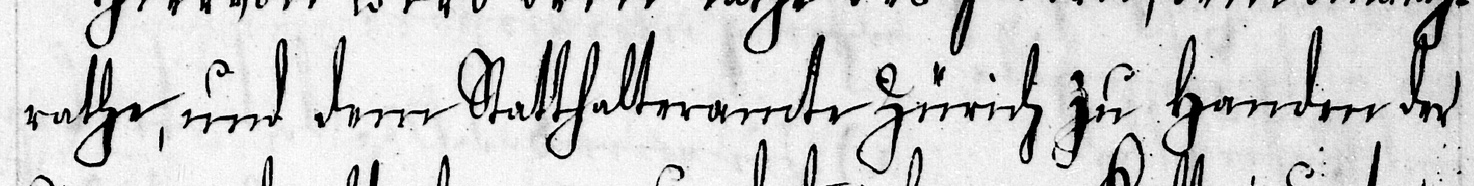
rathe, und dem Statthalteramte Zürich zu Handen der
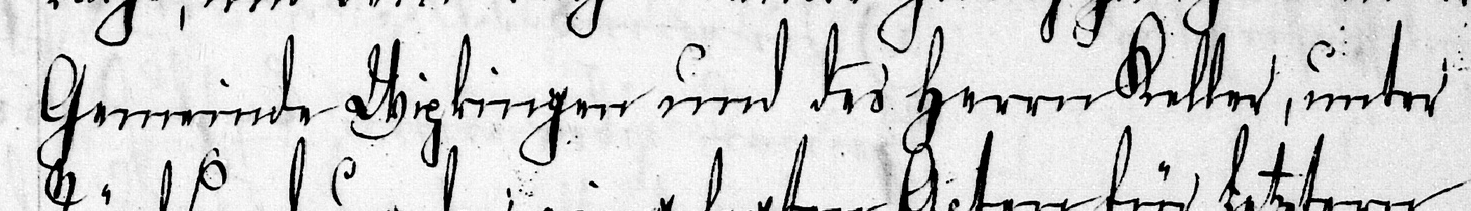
Gemeinde Wipkingen und des Herrn Keller, unter
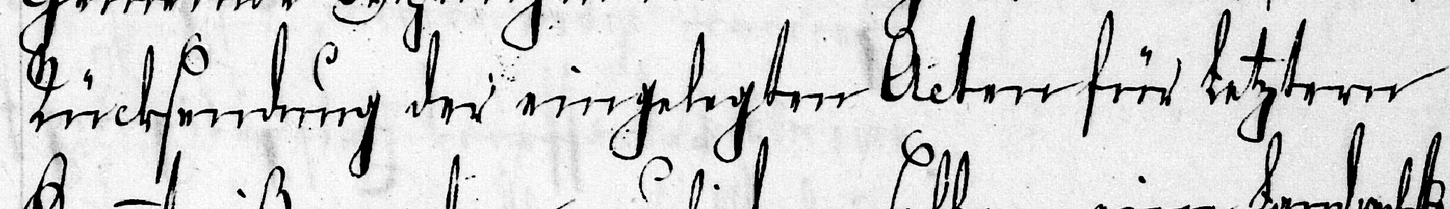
Rücksendung der eingelegten Acten für Letztern
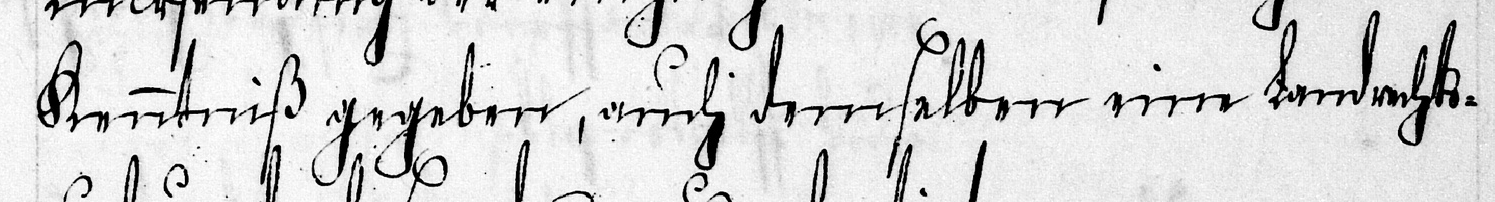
Kenntniß gegeben, auch demselben eine Landrechts¬
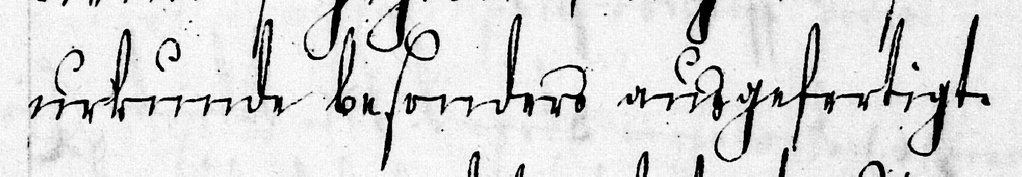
urkunde besonders ausgefertigt.
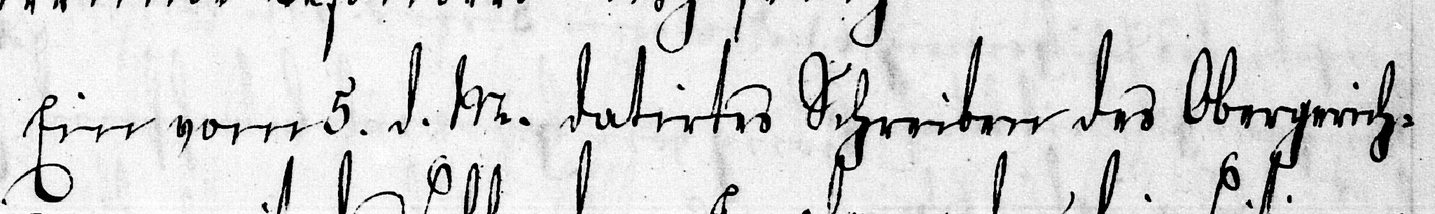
Ein vom 5. d. M. datirtes Schreiben des Obergerich¬
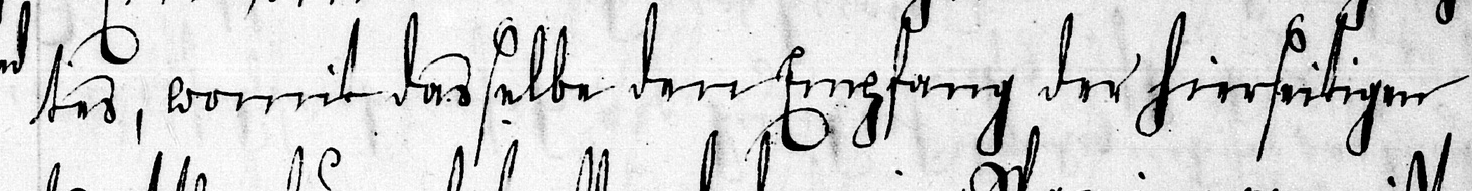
tes, womit dasselbe den Empfang der hierseitigen
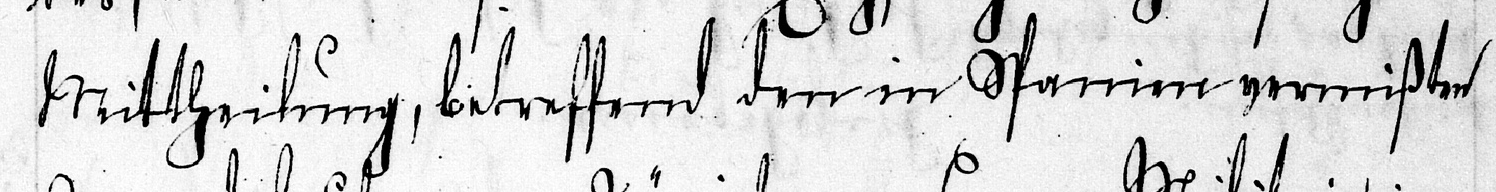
Mittheilung, betreffend den in Spanien vermißten
